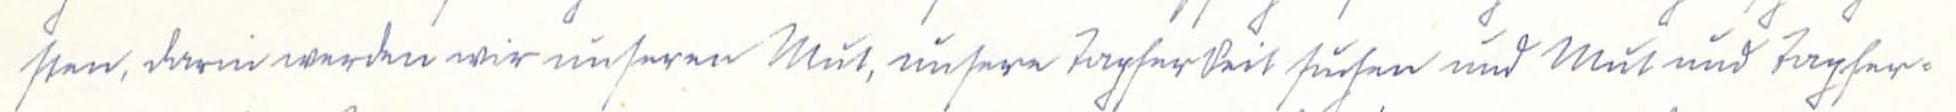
sten, dann werden wir unseren Mut, unsere Tapferkeit suchen und Mut und Tapfer-
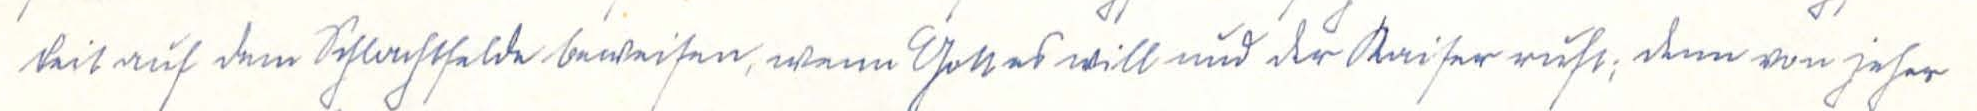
keit auf dem Schlachtfelde beweisen, wenn Gott es will und der Kaiser ruft, denn von jeher
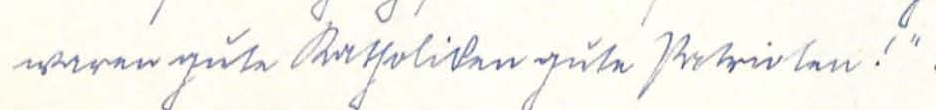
waren gute Katholiken gute Patrioten!"
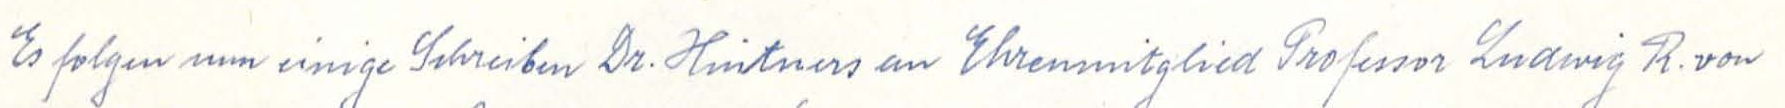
Es folgen nun einige Schreiben Dr. Hintners an Ehrenmitglied Professor Ludwig R. von
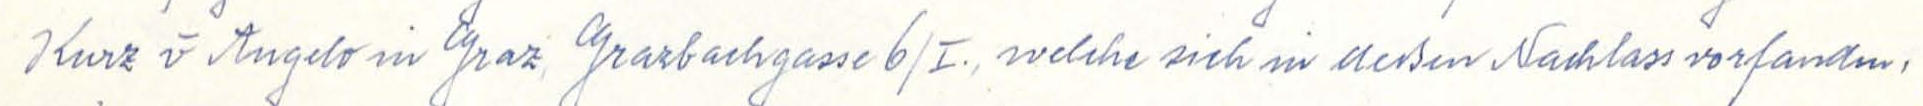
Kurz v/o Angelo in Graz Grabengasse 6/I., welche sich in deßen Nachlass vorfanden,
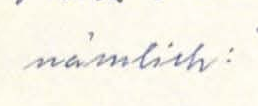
nämlich:
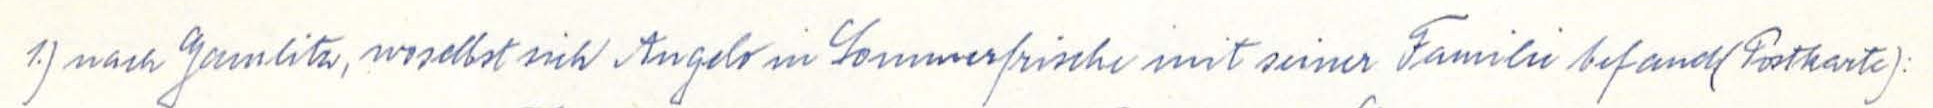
1.) nach Gamlitz, woselbst sich Angelo in Sommerfrische mit seiner Familie befand (Postkarte):
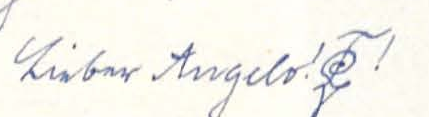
Lieber Angelo! CI!
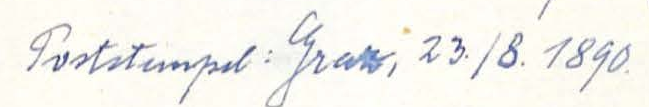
Poststempel: Graz, 23. / 8. 1890
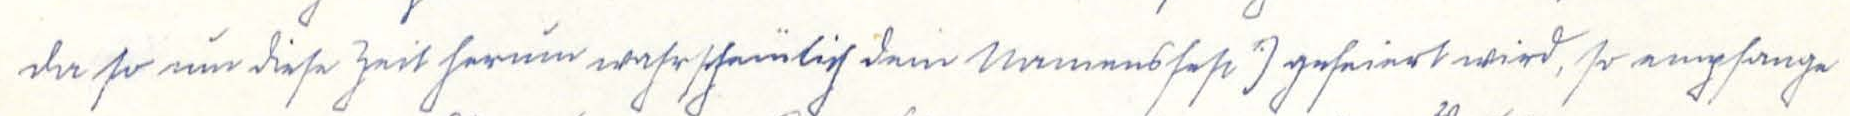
Da so um diese Zeit herum wahrscheinlich dein Namensfest 1.) gefeiert wird, so empfange
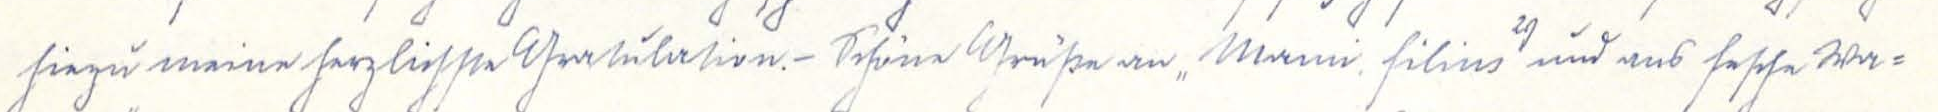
hiezu meine herzlichste Gratulation.- Schöne Grüße an "Mami filius 2.) und ans fesche Wa-
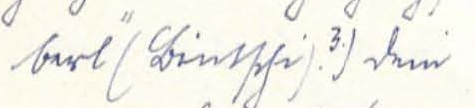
berl" (Bnitschi) 3.) dein
